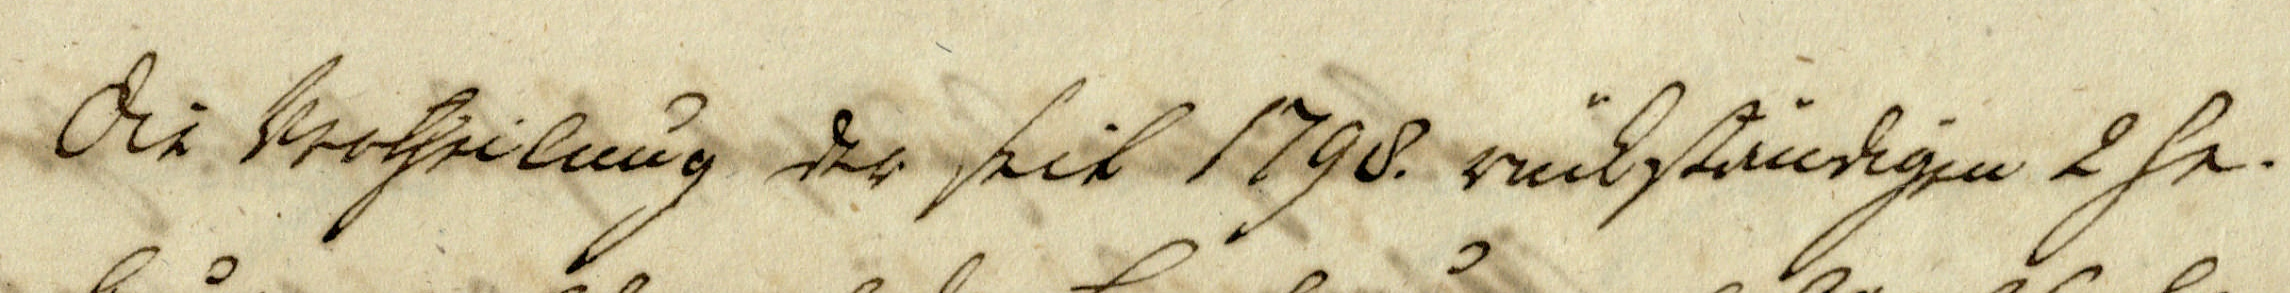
Die Vertheilung der seit 1798. rückständigen 2 He¬
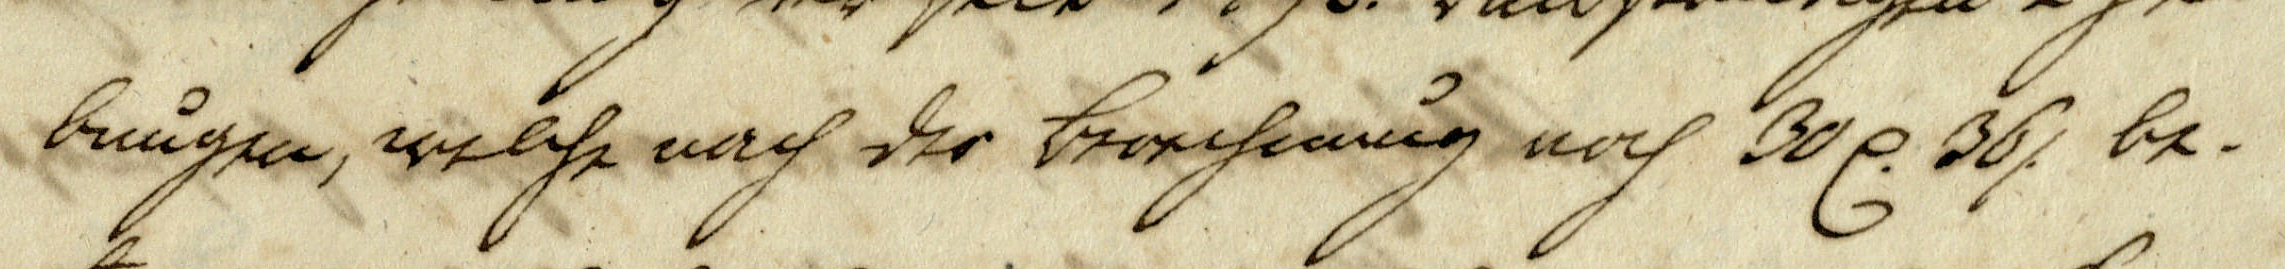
bungen, welche nach der Berechnung noch 30 l. 36 s. be¬
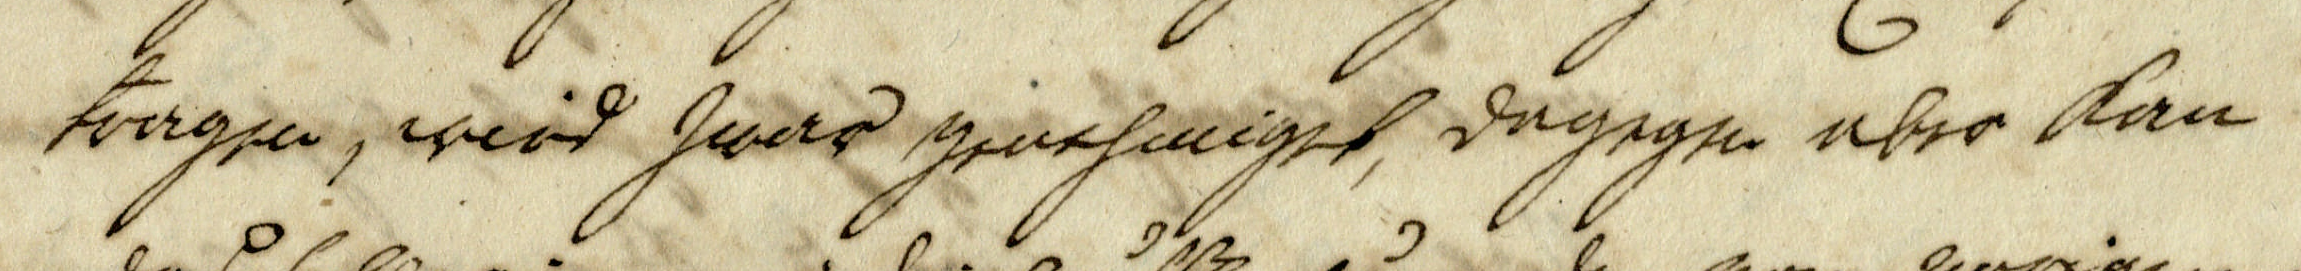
tragen, wird zwar genehmiget, dagegen aber kan
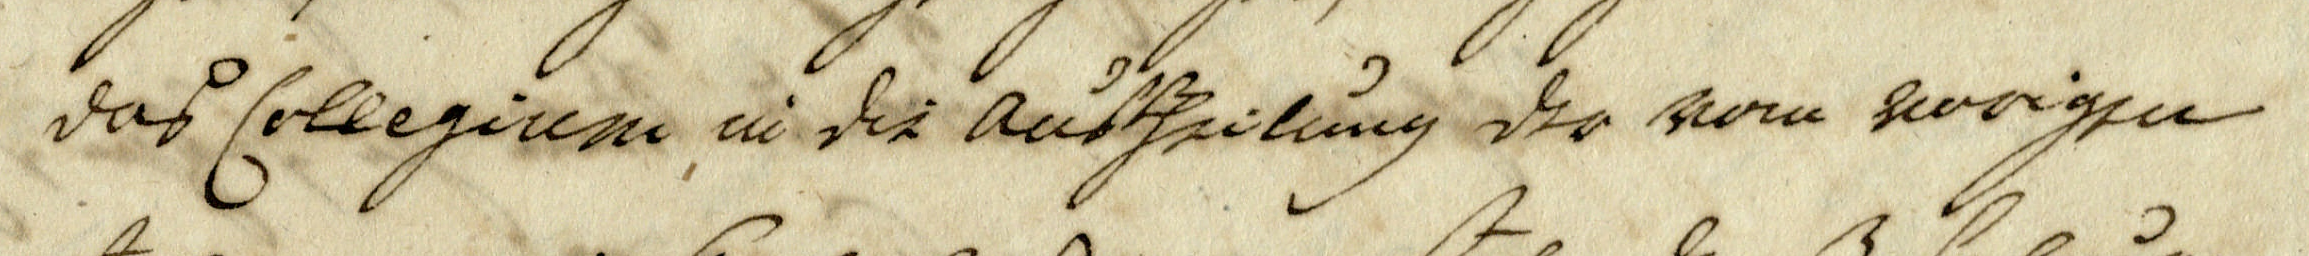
das Collegium in die Austheilung der vom vorigen
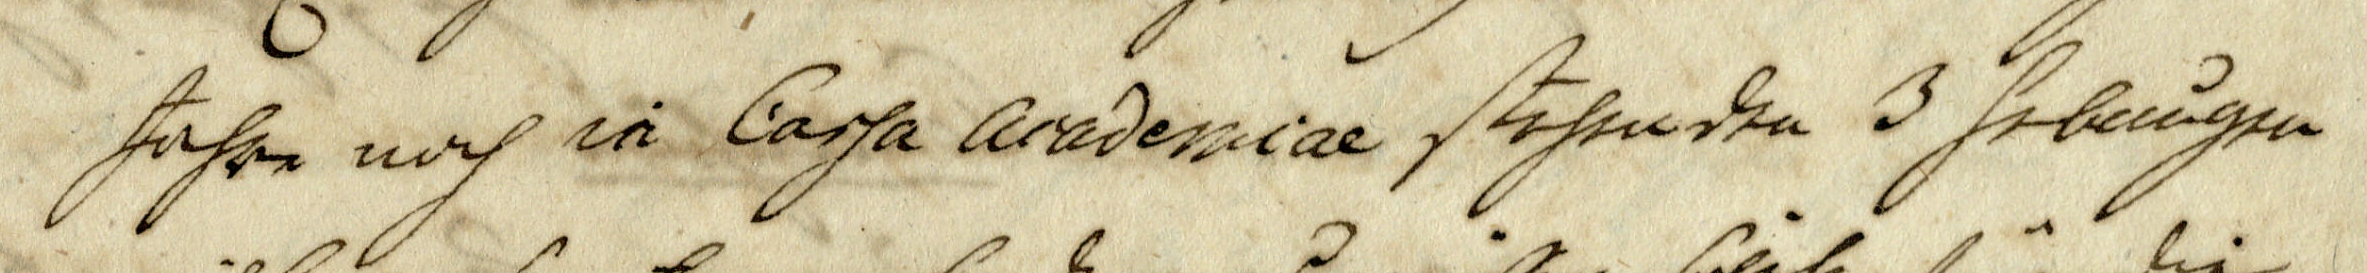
Jahre noch in Cassa Academiae stehenden 3 Hebungen
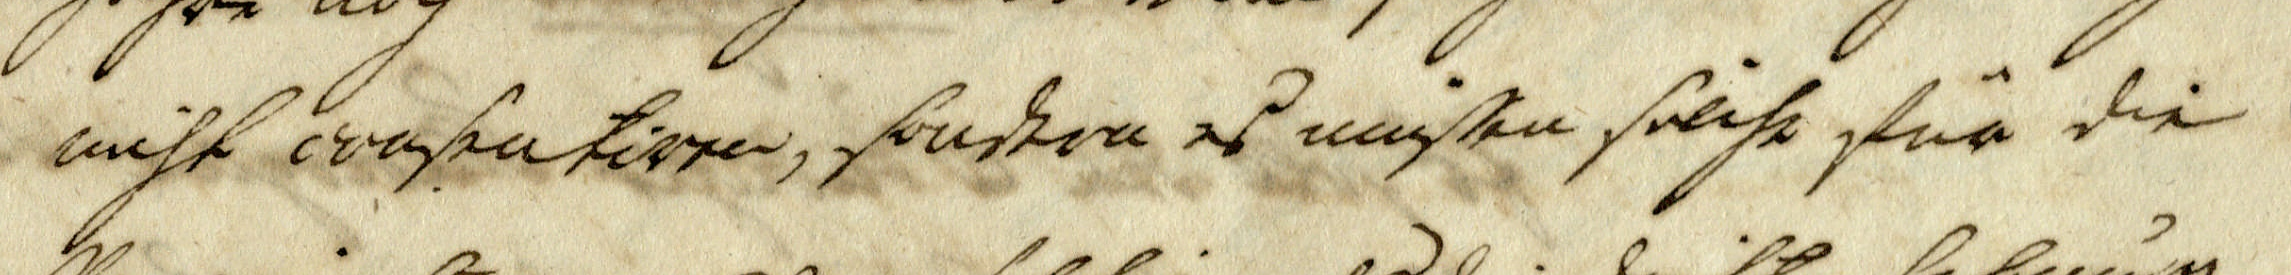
nicht consentiren, sondern es müssen solche für die
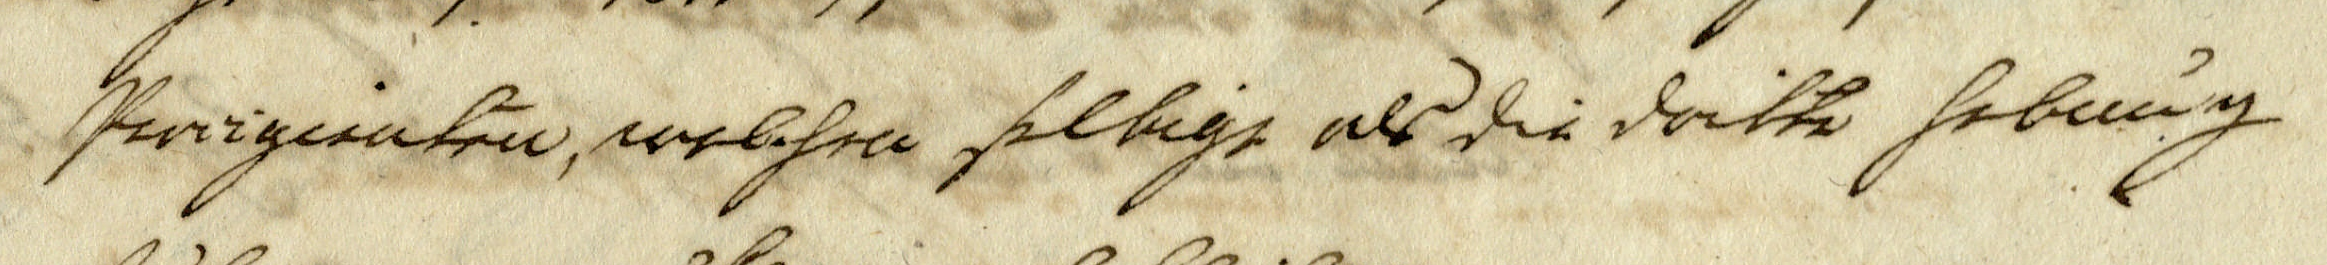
Percipienten, welchen selbige als die dritte Hebung
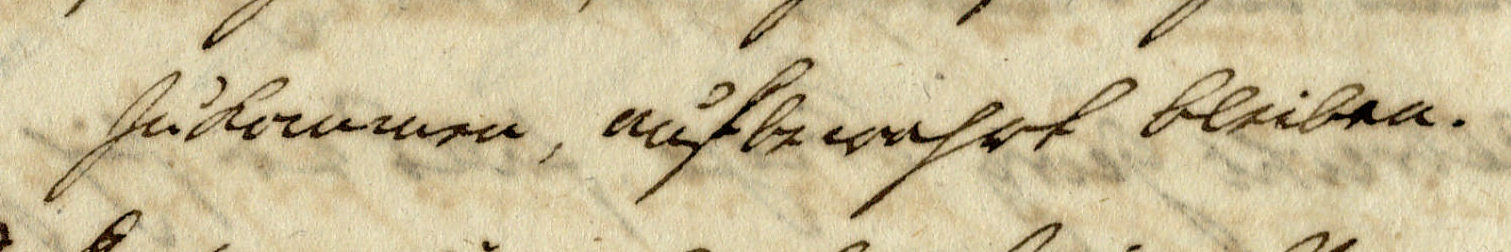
zukommen, aufbewahrt bleiben.
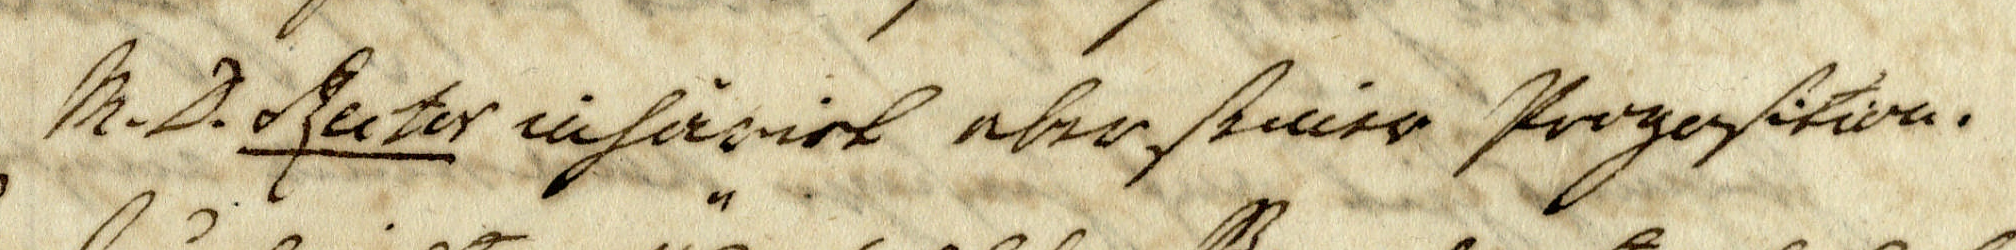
M. D. Rector inhärirt aber seiner Proposition.
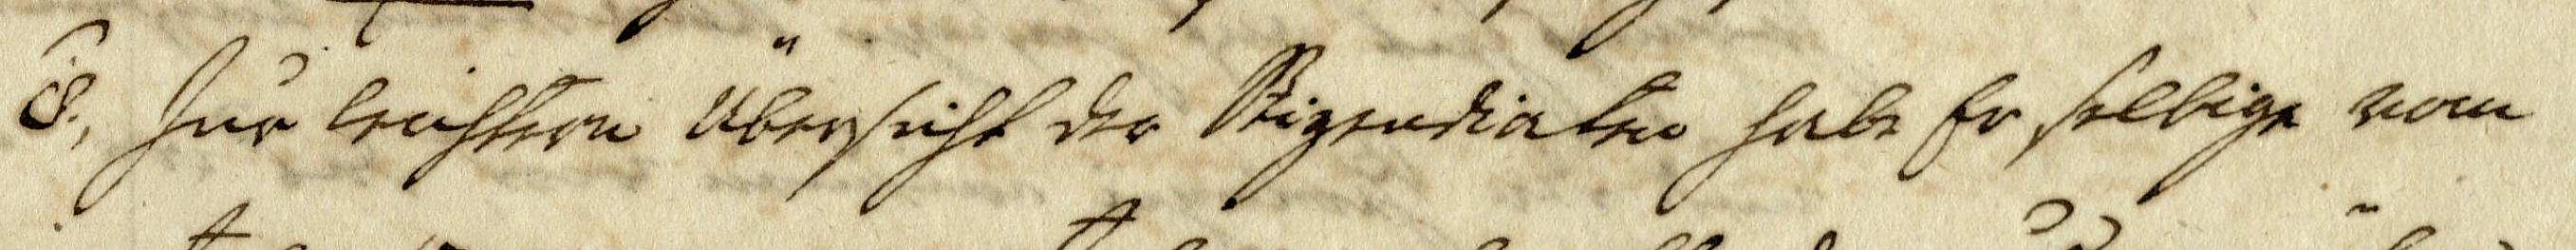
8., Zur leichtern Übersicht der Stipendiaten habe Er selbige vom
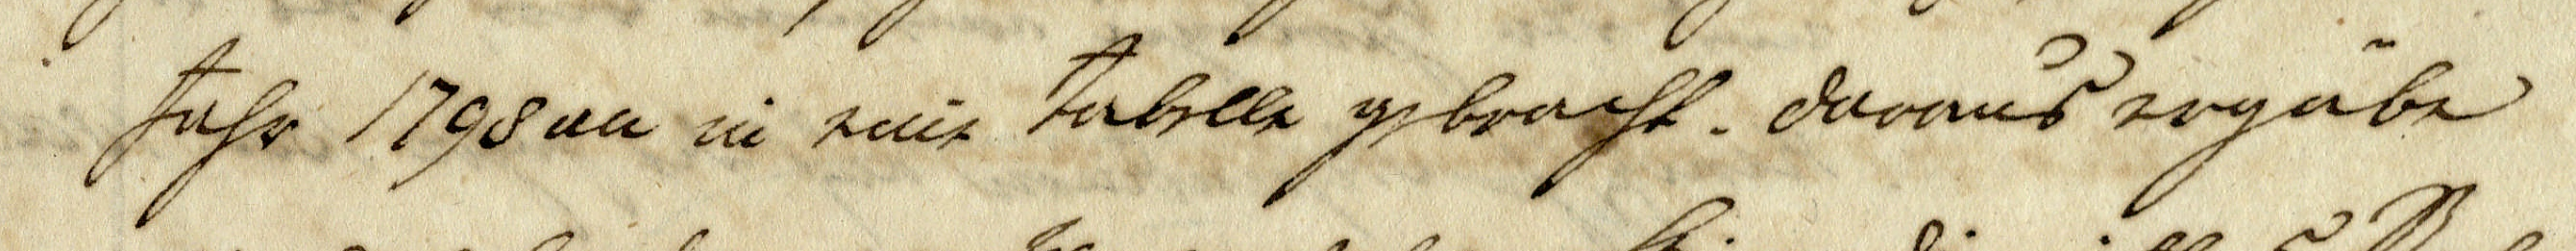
Jahr 1798 an in eine Tabelle gebracht. Daraus ergäbe
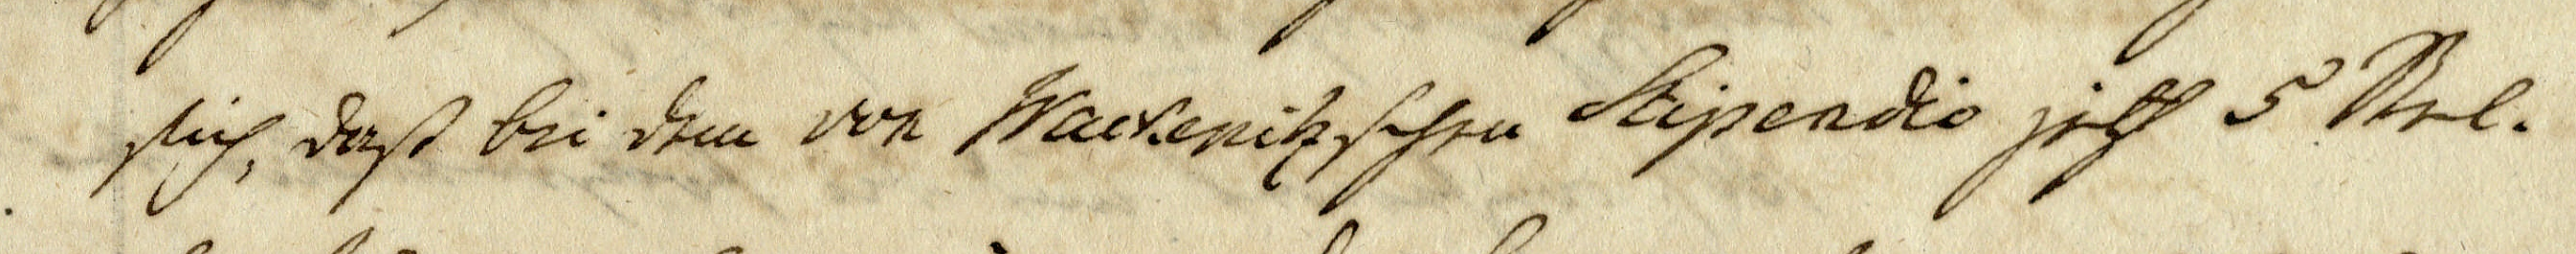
sich, daß bei dem von Wackenitzschen Stipendio jetzt 5 Stel¬
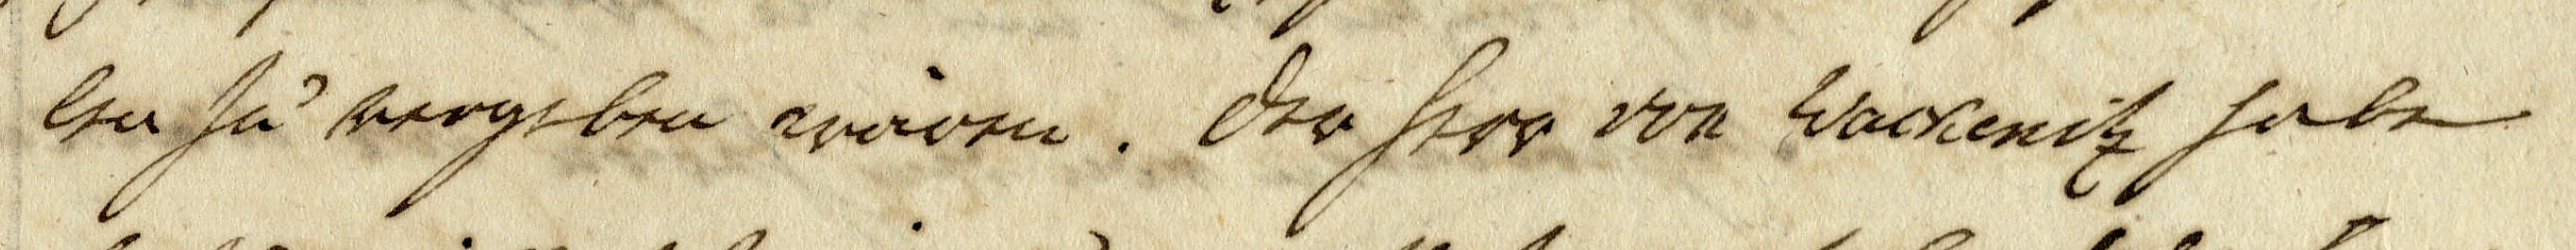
len zu vergeben wären. Der Herr von Wackenitz habe
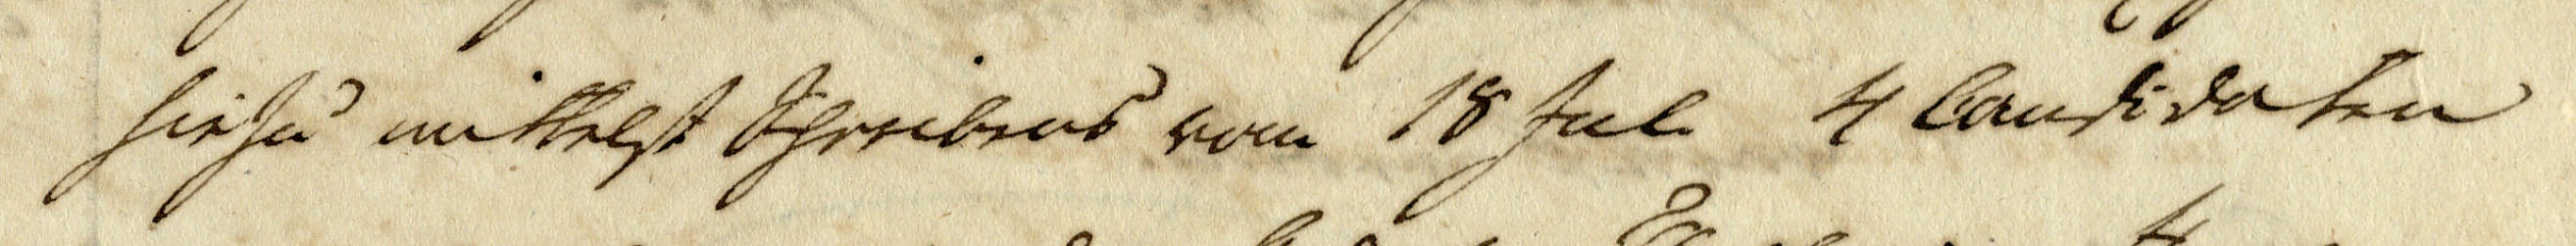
hiezu mittelst Schreibens vom 18 Jul. 4 Candidaten
